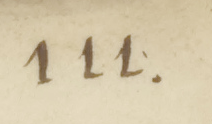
111.
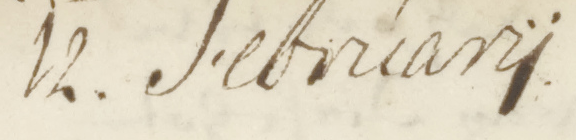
12. Februarij.
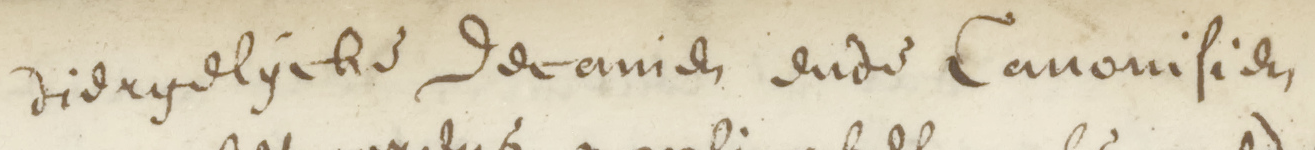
diergelijcke Decanien ende Canonisien
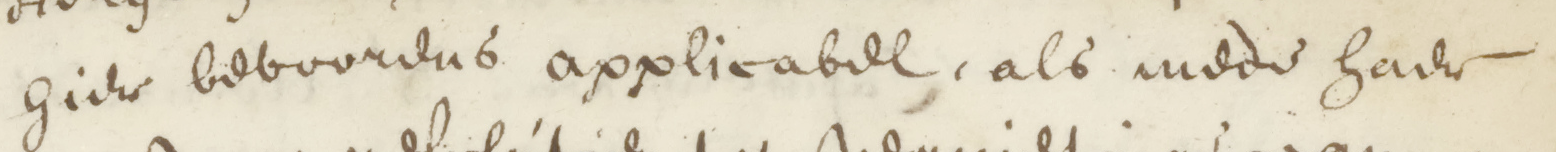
hier bevoorens applicabel, als mede haer
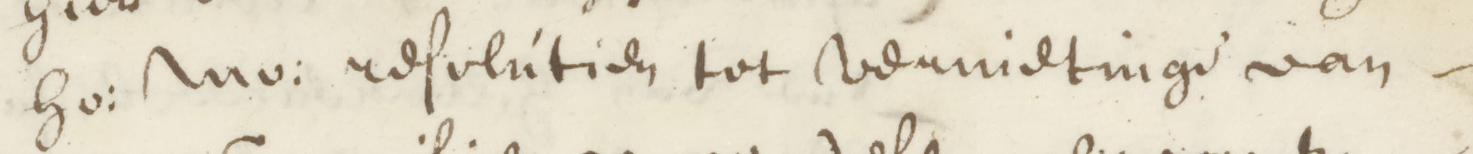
ho:Mo: resolutien tot vernietinge van
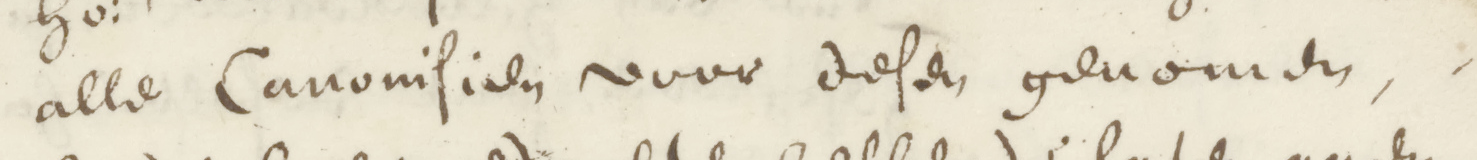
alle Canonisien voor desen genomen,
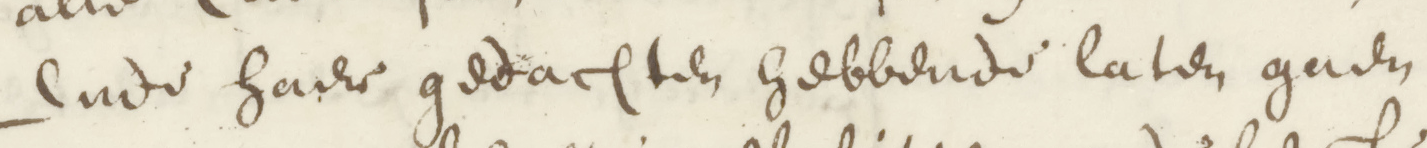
ende haer gedachten hebbende laten gaen,
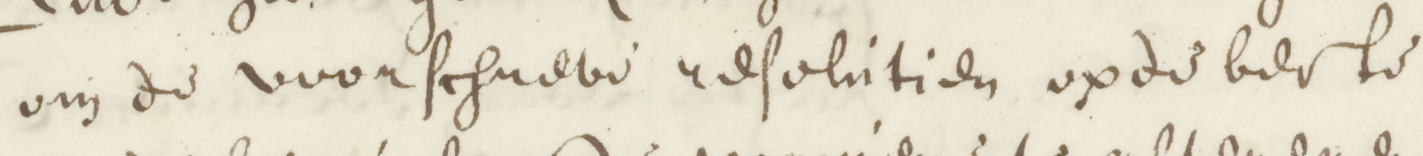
om de voorschreve resolutien opde beste
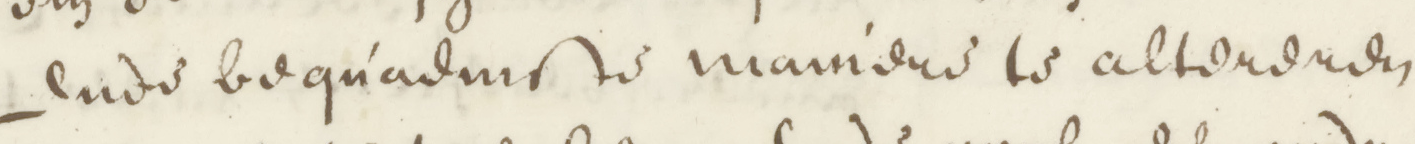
ende bequaemste maniere te altereren
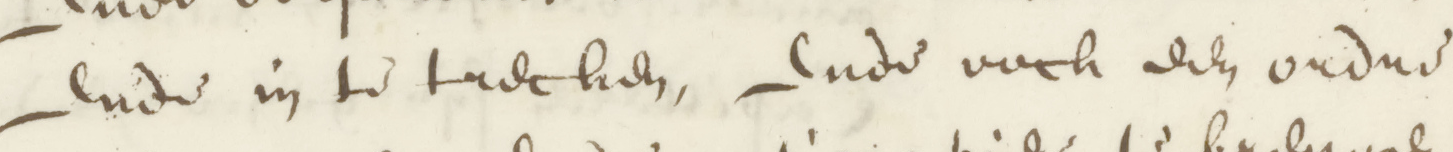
ende in te trecken, ende oock een ordre
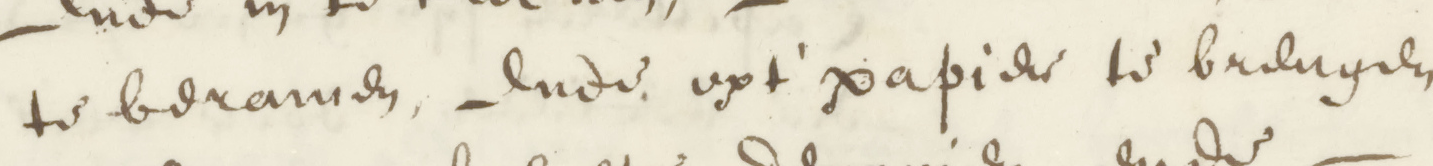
te beramen, ende opt‛ papier te brengen,
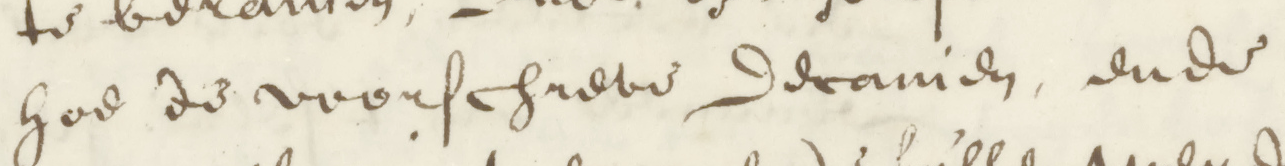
hoe de voorschreve Decanien, ende
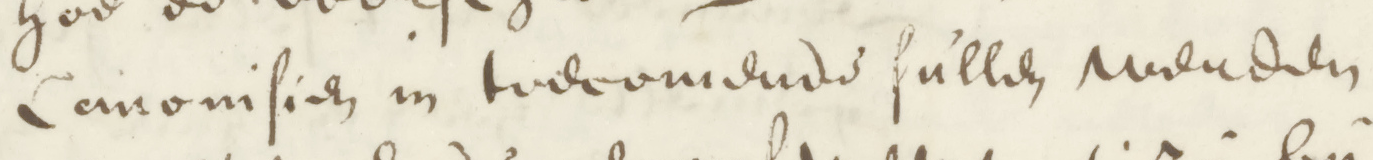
Canonisien in toecomende sullen werden
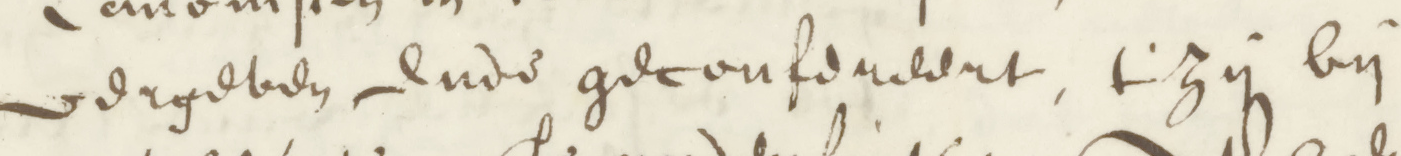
vergeven ende geconfereert t'zij bij
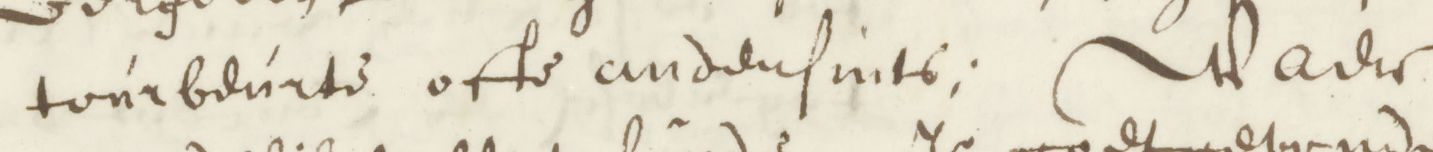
tourbeurte ofte andersints: Waer
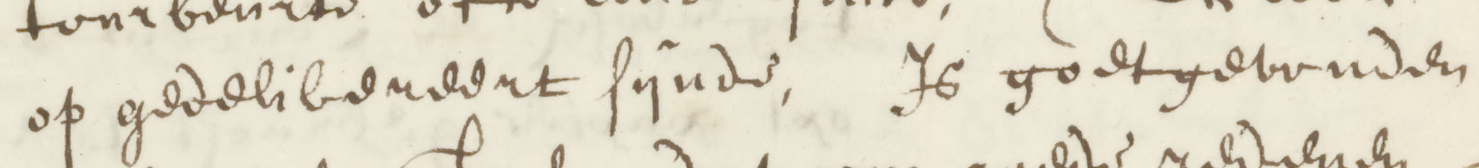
op gedelibereert sijnde, Is goetgevonden
